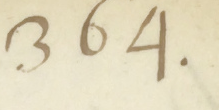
364.
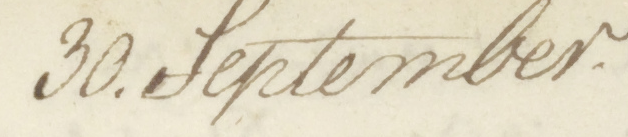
30. September.
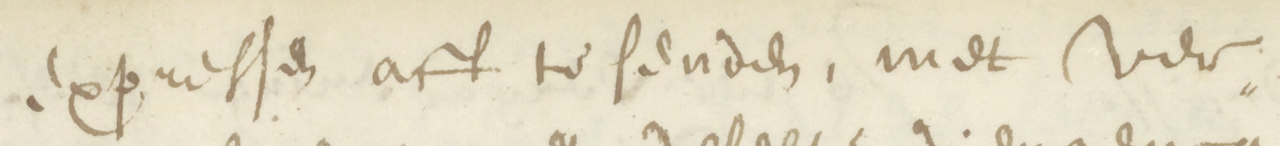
expressen aff te senden, met ver„
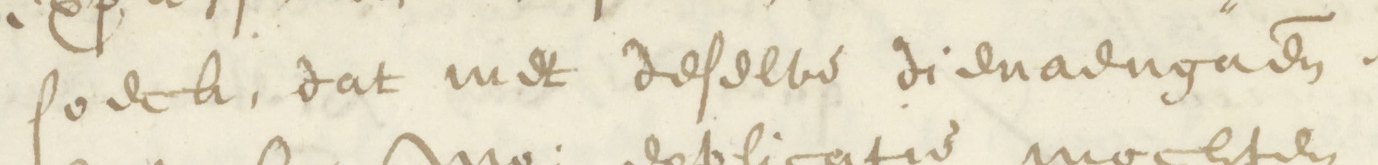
soeck, dat met deselve dienaengaen
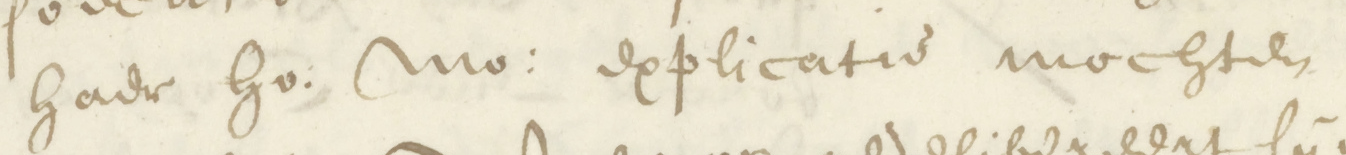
haer ho:Mo: explicatie mochten
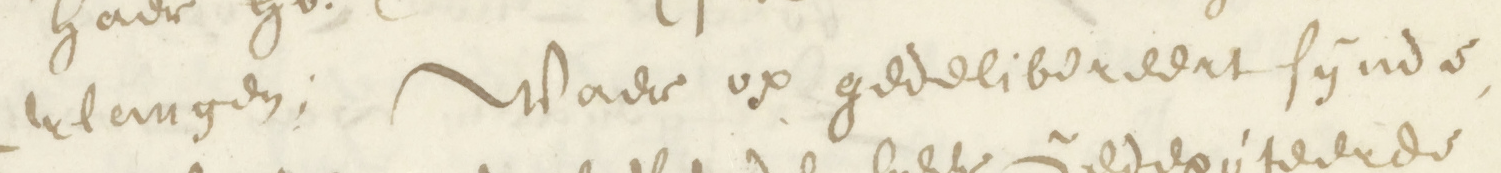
erlangen: Waer op gedelibereert sijnde,
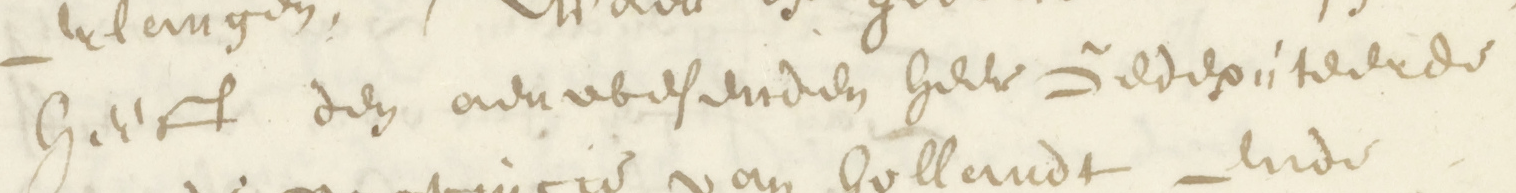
heeft den aenwesenden heer Gedeputeerde
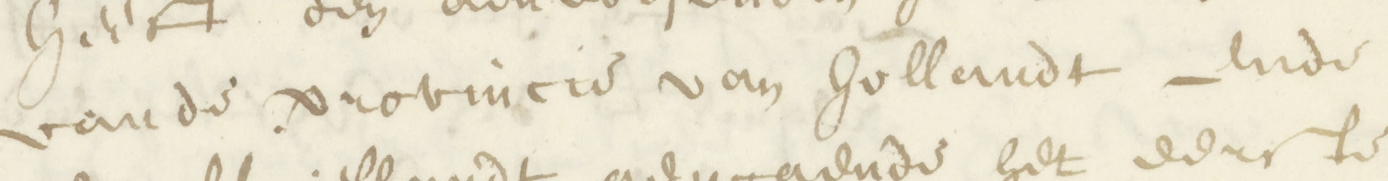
vande provincie van hollandt ende
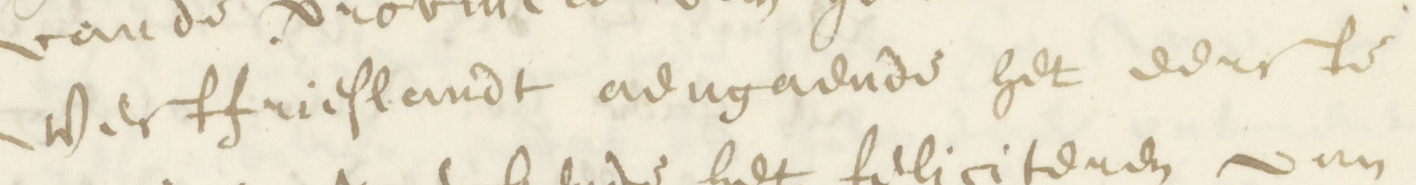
Westfrieslandt aengaende het eerste
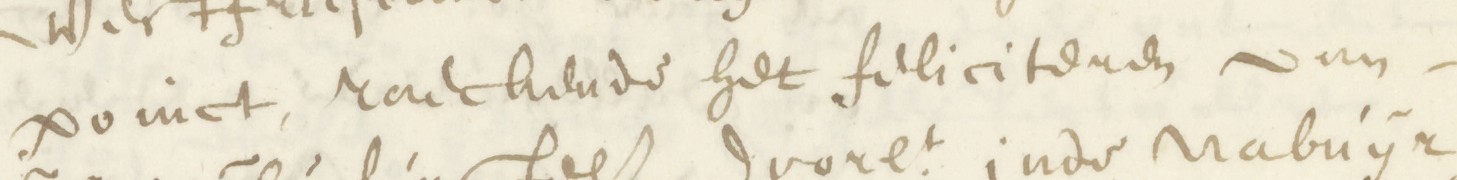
poinct, raeckende het feliciteren van
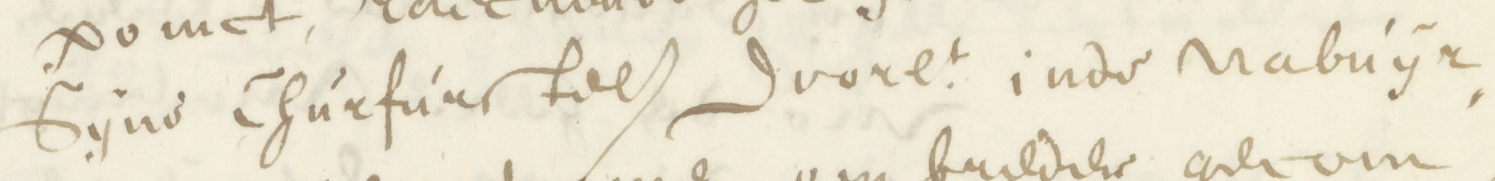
Sijne Churfurstel Doorlt. inde Nabuijr„
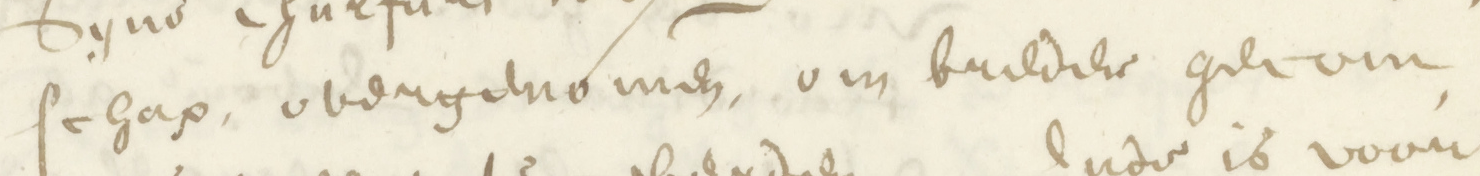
schap, overgenomen, om breder gecom„
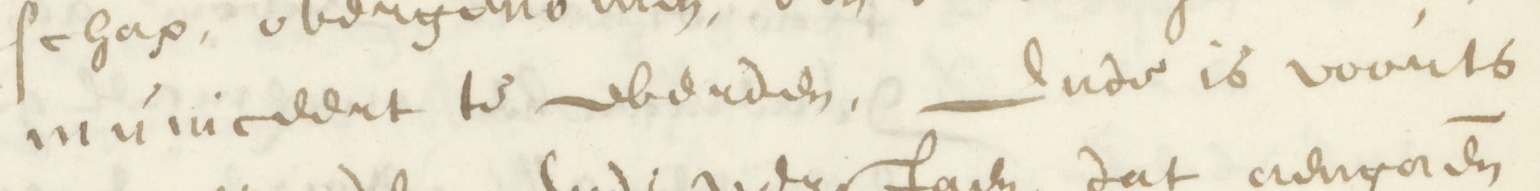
municeert te werden. Ende is voorts
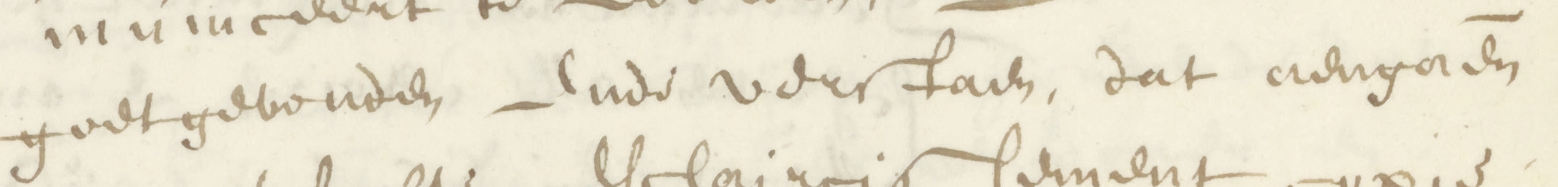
goetgevonden ende verstaen, dat aengaen
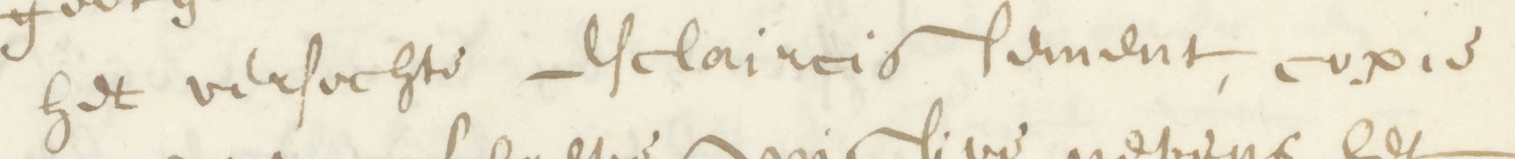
het versochte esclaircissement, copie
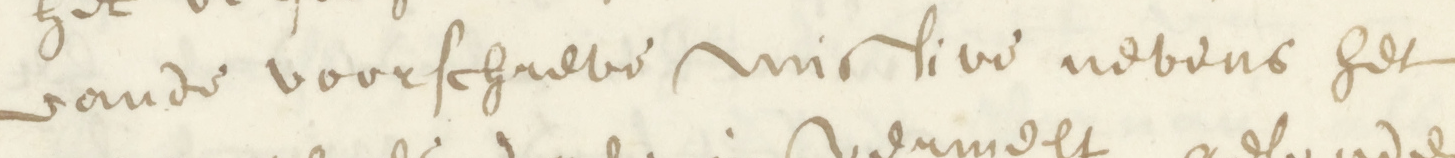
vande voorschreve missive nevens het
